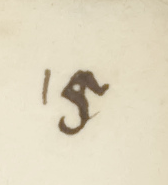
15
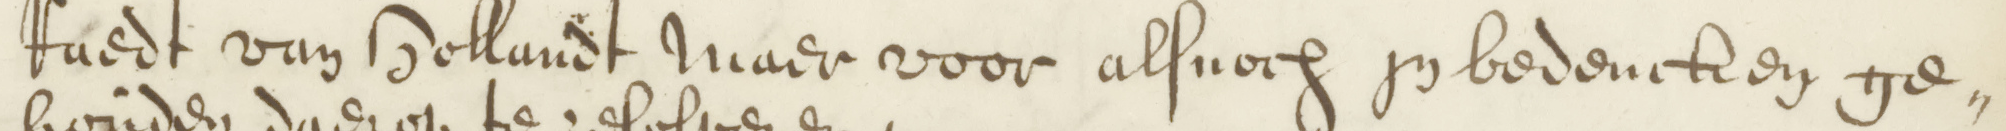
Raedt van Hollandt maer voor alsnoch in bedencken ge„
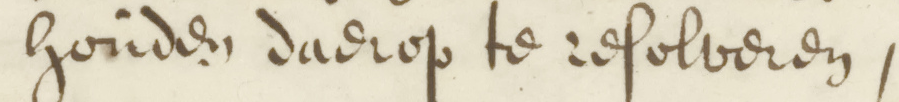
houden daerop te resolveren.
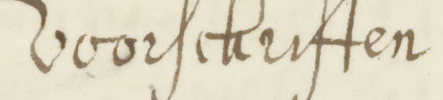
voorschriften
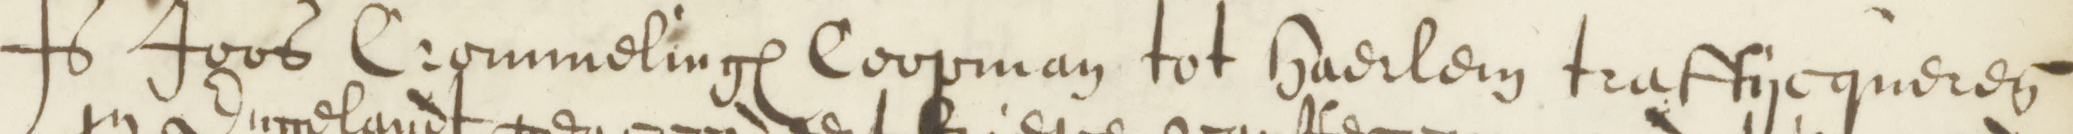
Is Joos Crommelingh Coopman tot Haerlem traffijcqueren
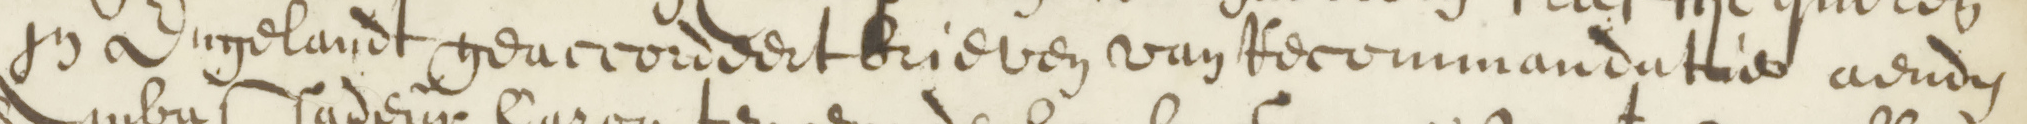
in Engelandt geaccordeert brieven van Recommandatie aenden
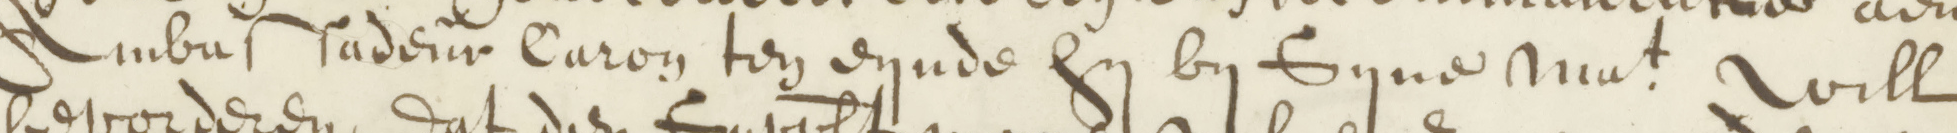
Ambassadeur Caron ten eynde hy by Syne Mat. will
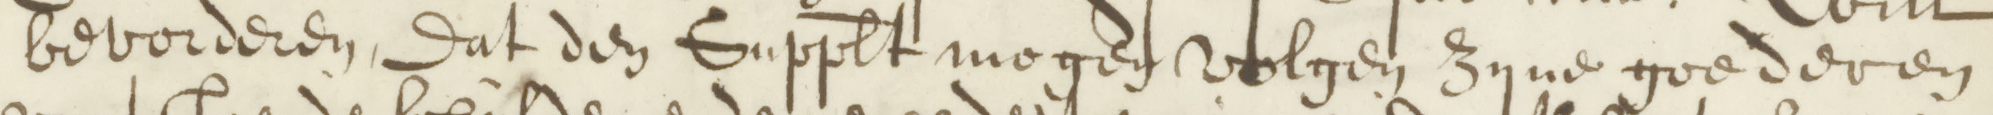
bevorderen, dat den Supplt mogen volgen zyne goederen,
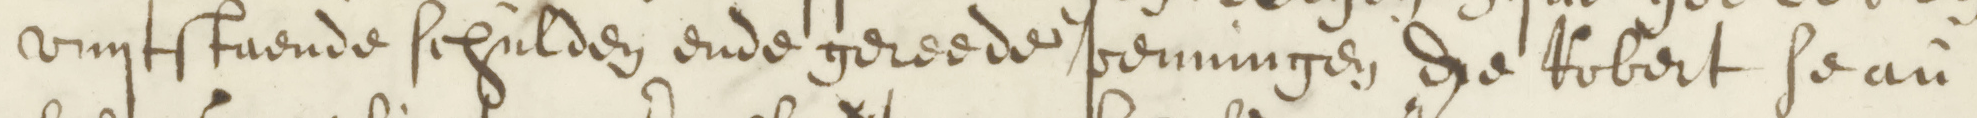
vuytstaende schulden ende gereede penningen die Robert Seau
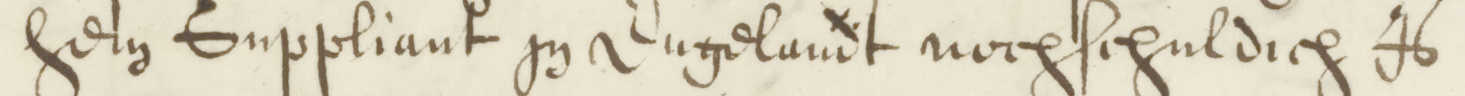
hem Suppliant in Engelandt noch schuldich Is
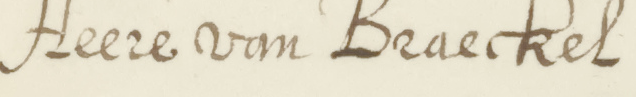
Heere van Braeckel
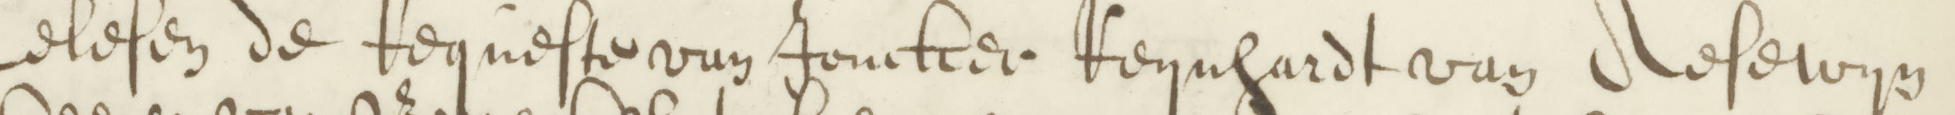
Gelesen de Requeste van Joncker Reynhardt van Aesewyn
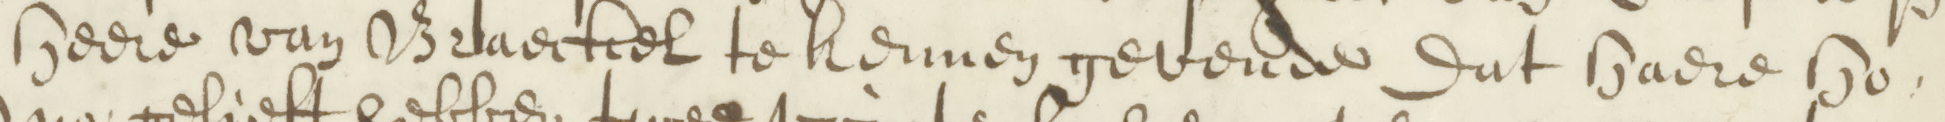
Heere van Braeckel te kennen gevende dat Haere Ho:
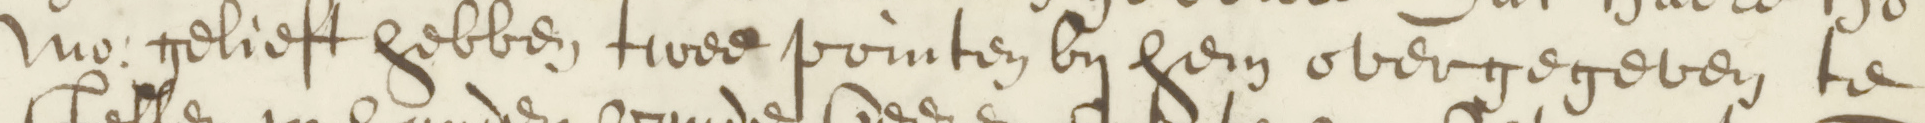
Mo: gelieft hebben twee pointen by hem overgegeven te
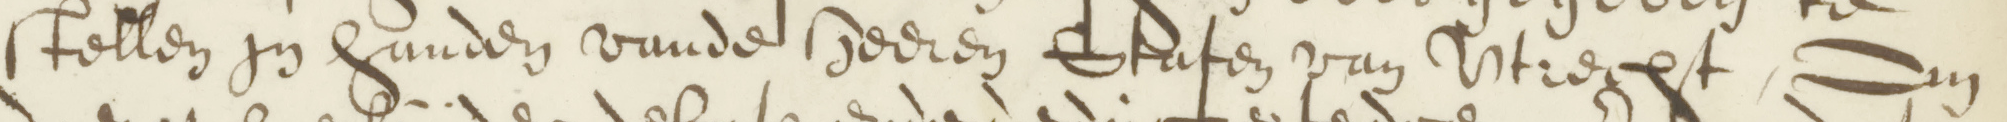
stellen in handen vande Heeren Staten van Utrecht, Om
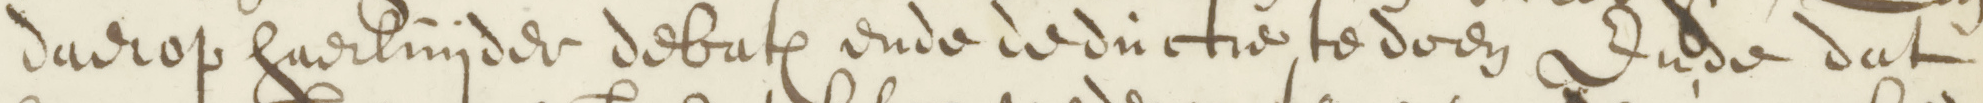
daerop haerluijder debath ende deductie te doen Ende dat
